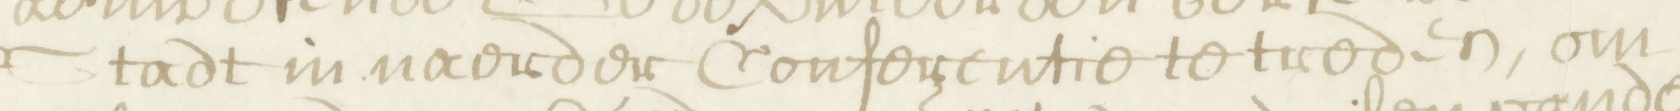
Stadt in naerder Conferentie te treden, om
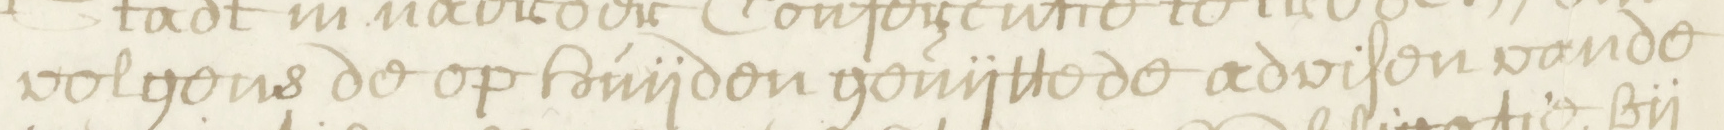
volgens de op huijden geuijtte de advisen vande
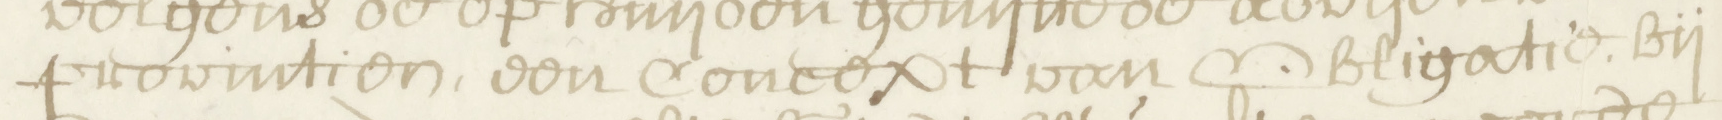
provintien, een concept van Obligatie, bij
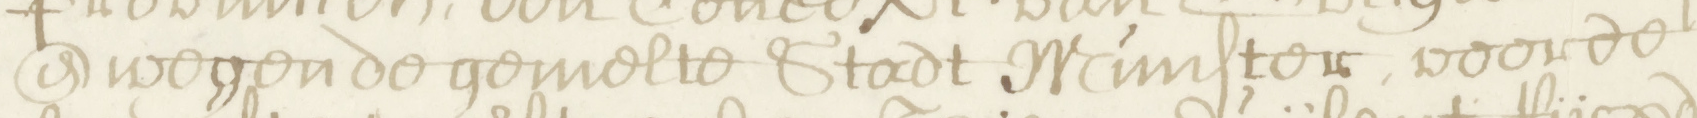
& wegen de gemelte Stadt Munster, voorde
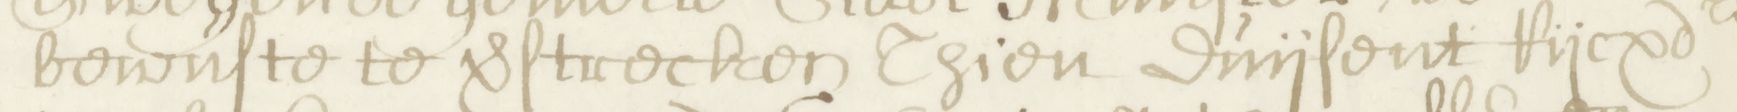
bewuste te vstrecken Thien Duijsent Rijcxdrs.
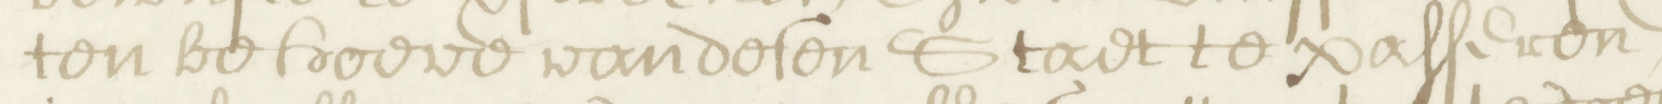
ten behoeve van desen Staet te passeren,
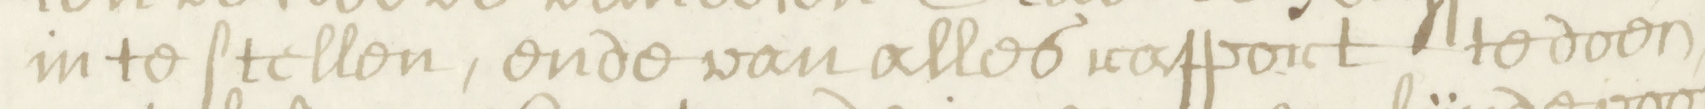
in te stellen, ende van alles rapport te doen,
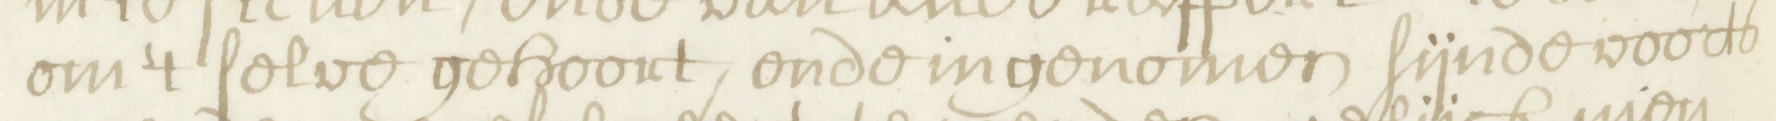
om 't selve gehoort, ende ingenomen sijnde voorts
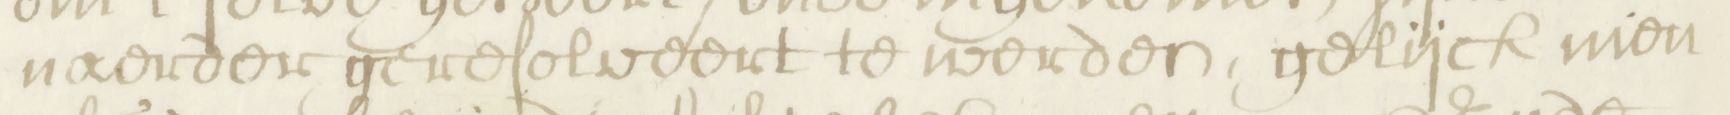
naerder geresolveert te werden, gelijck men
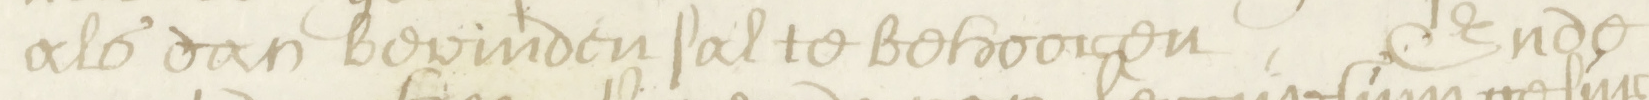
als dan bevinden sal te behooren. Ende
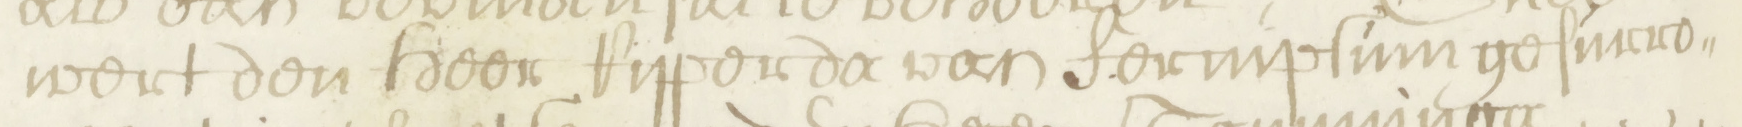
wert den Heer Ripperda van Fermpsum gesurro,,
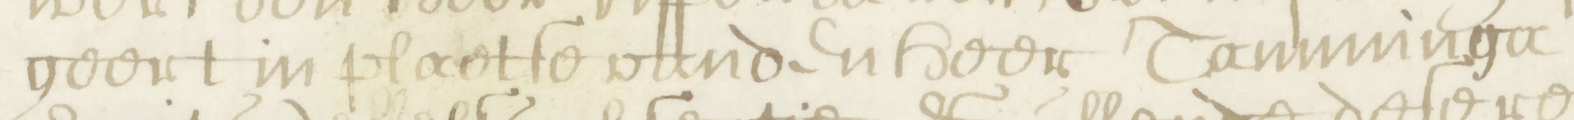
geert in plaetse vanden heer Tamminga
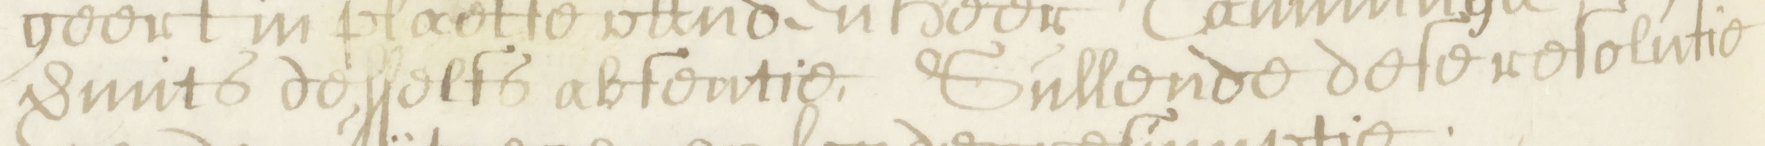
vmits desselfs absentie. Sullende dese resolutie
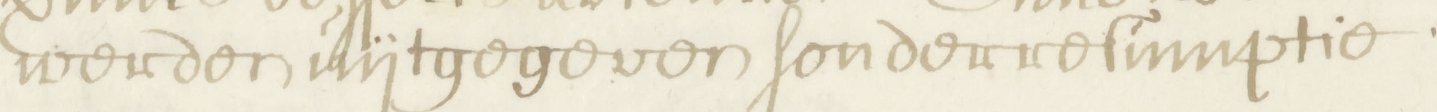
werden uijtgegeven sonder resumptie
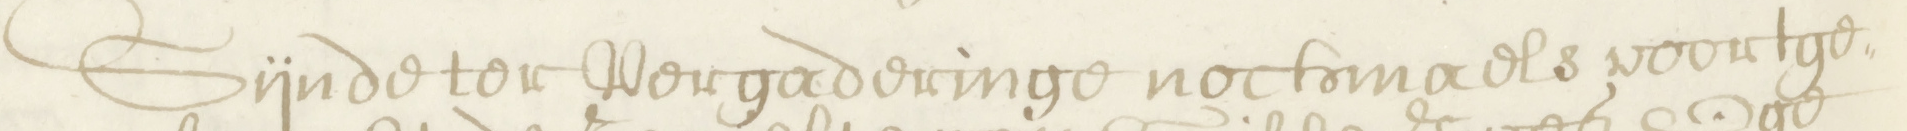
Sijnde ter Vergaderinge nochmaels voortge„,
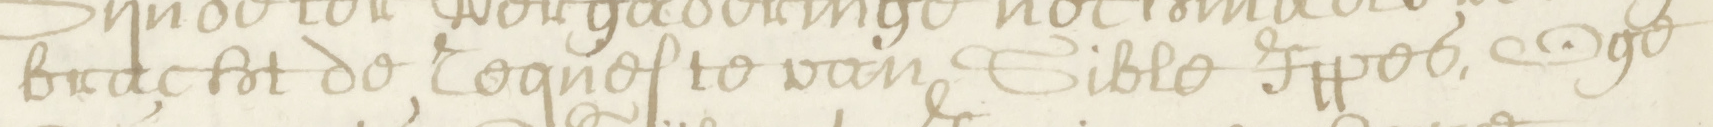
bracht de requeste van Tibbe Ippes, Oge
